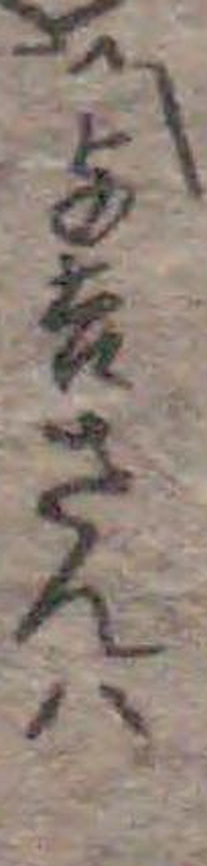〽与吉さんは
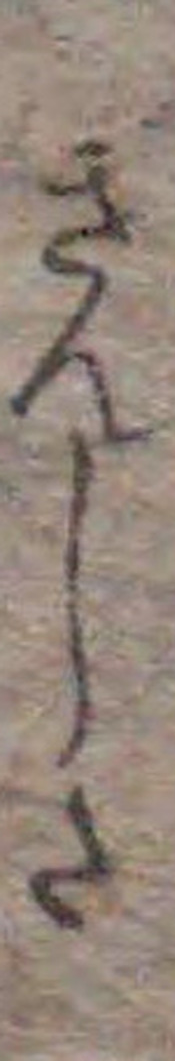きんした
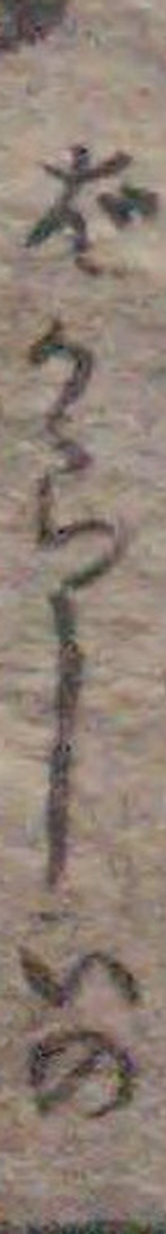ばからしいの
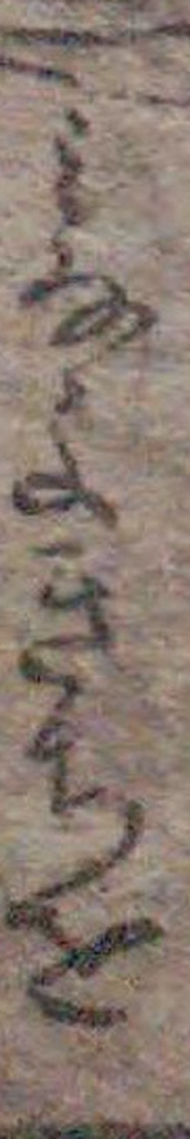みなよきちを
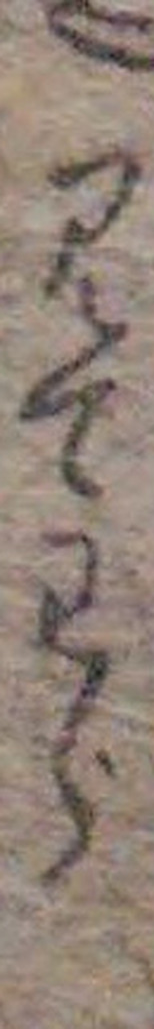見てわら

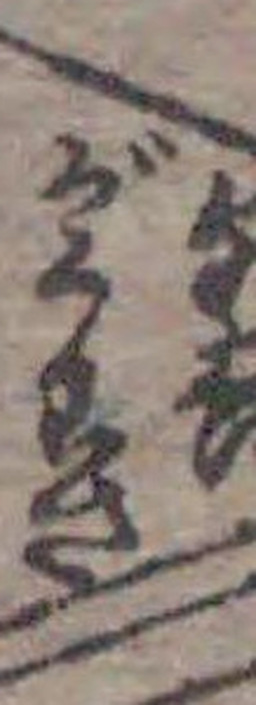がうわさ
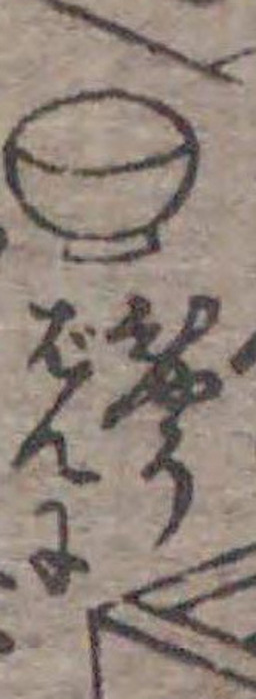ばんに
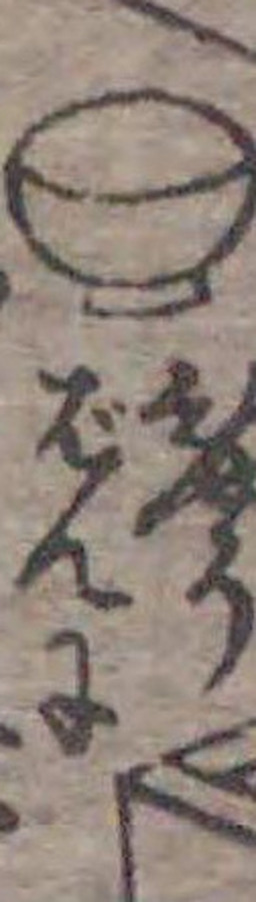ばんに
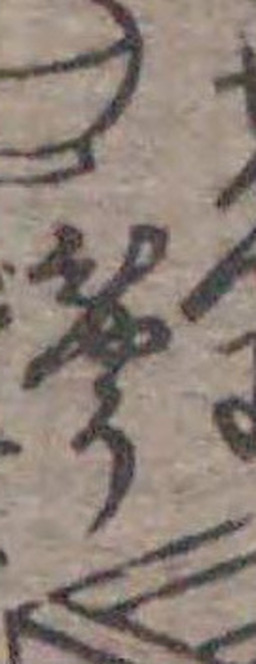ひやう
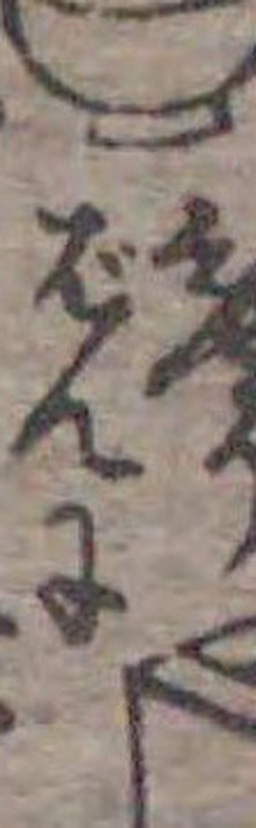ばんに
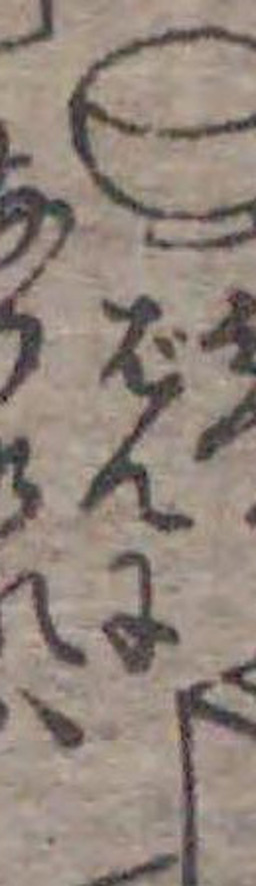なりけれは
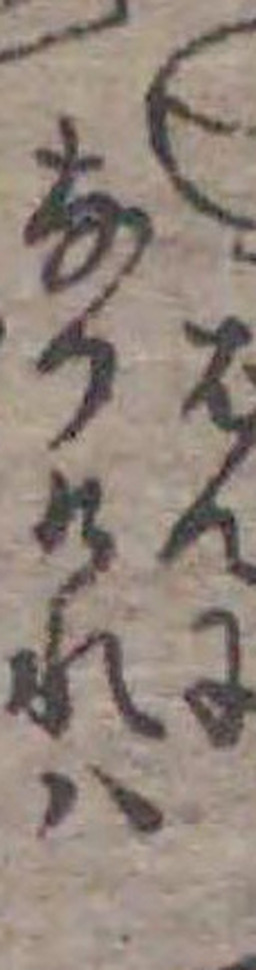なりけれは
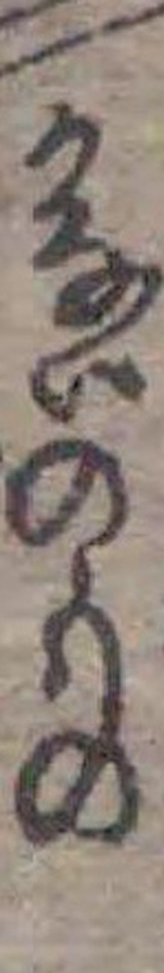かないのもの
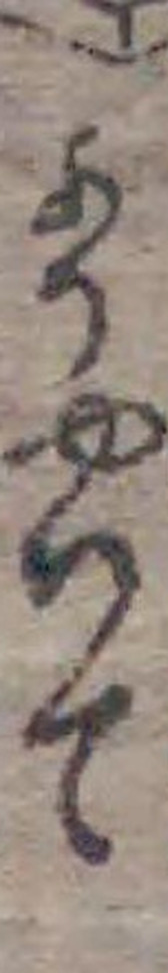よりやいて
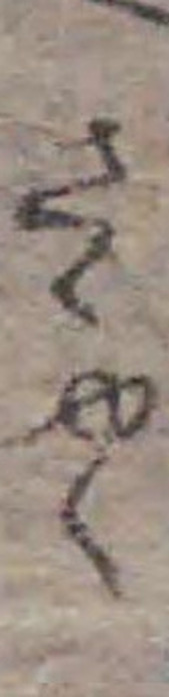さゝやく
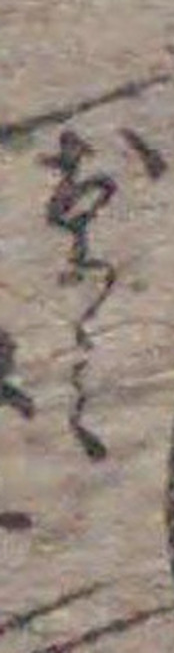おかみ
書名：神田与吉一代記 : 3巻
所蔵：国立国会図書館 National Diet Library, JAPAN
